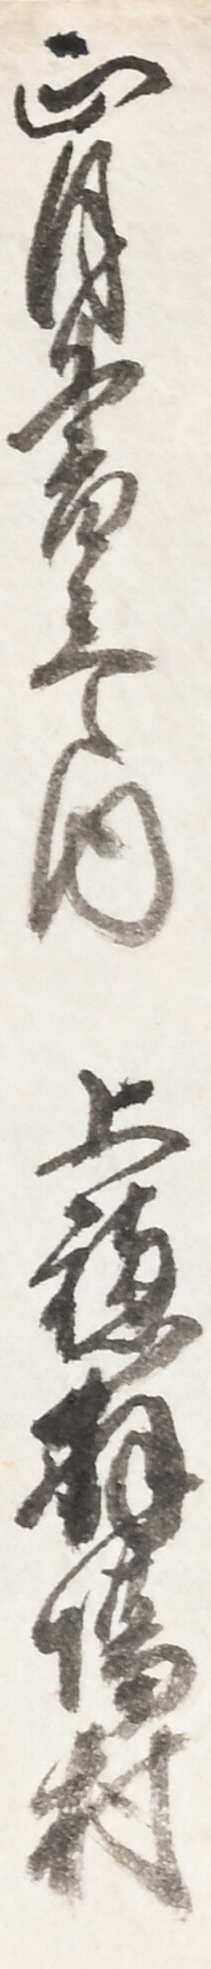正月書上之内上穂羽場村
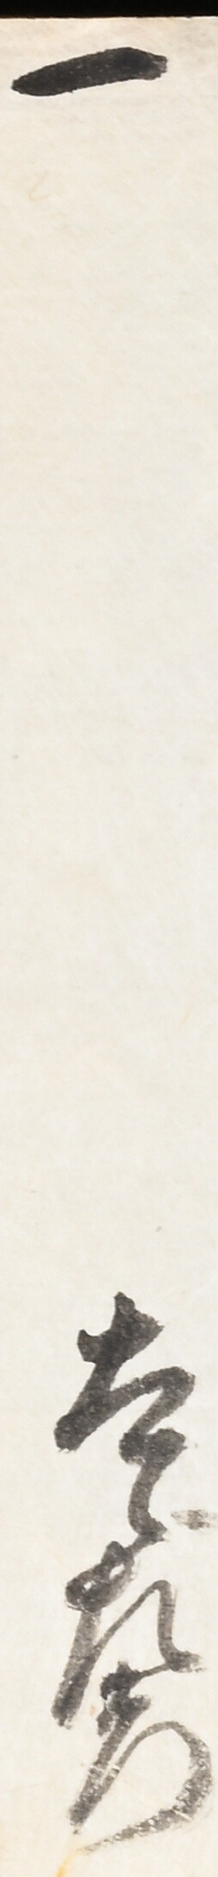一太郎左衛門
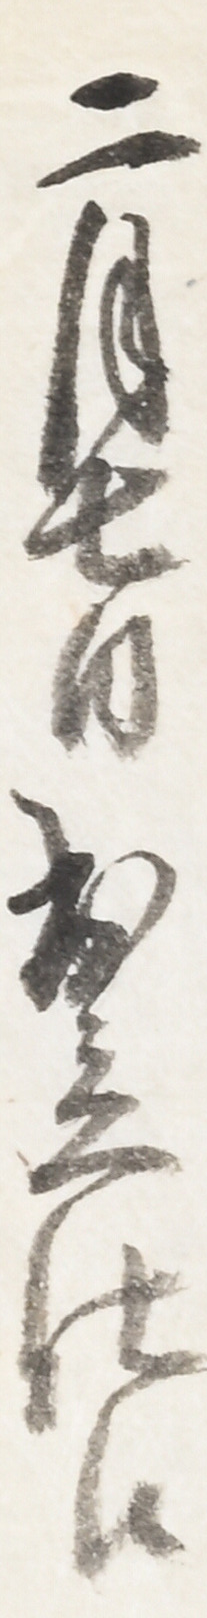二月七日出立仕候
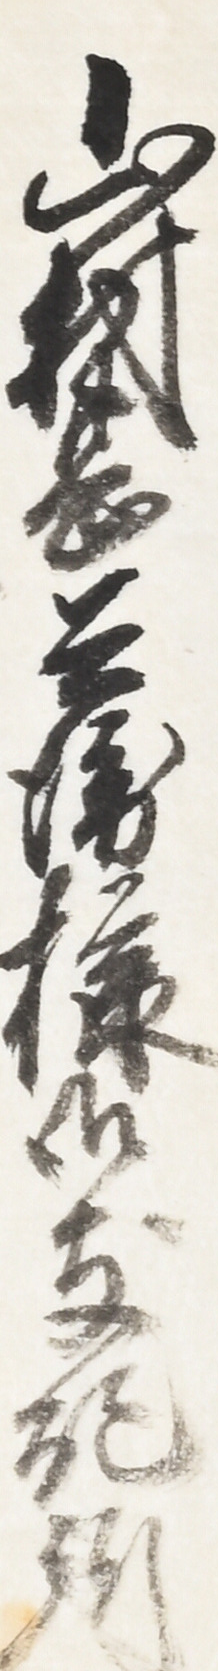山村甚兵衛様御支配所
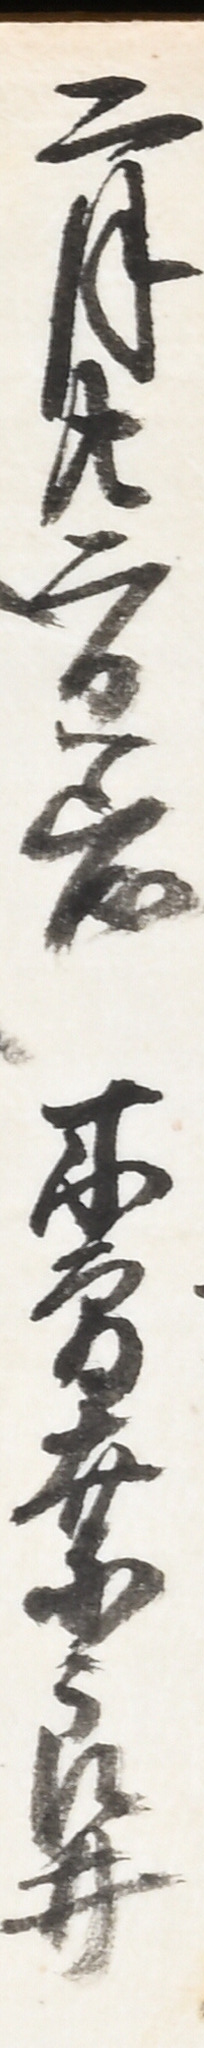二月廿二日着木曾奈良井
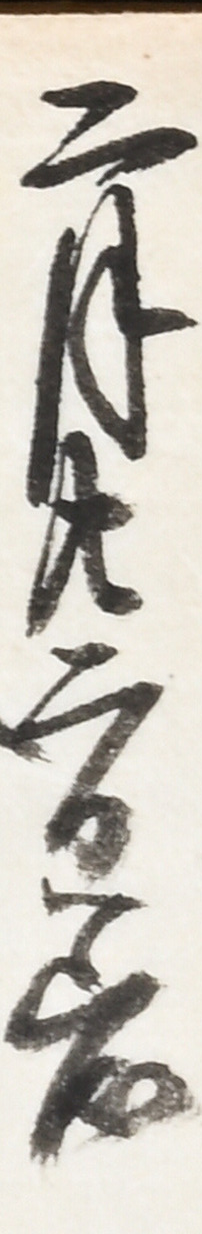二月廿四日嫡
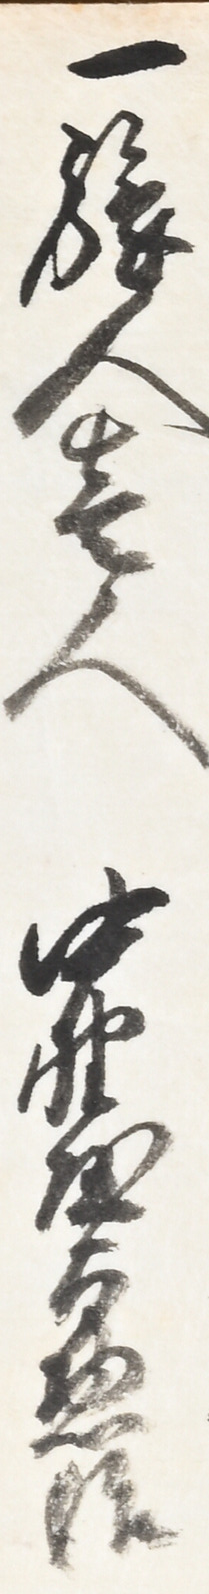一旅人壱人中野屋与惣治
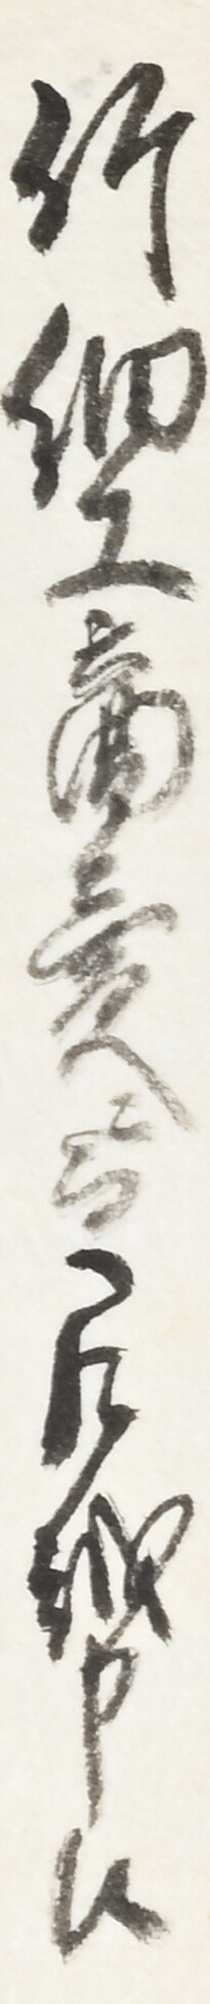竹細工商売ニ而罷越申候
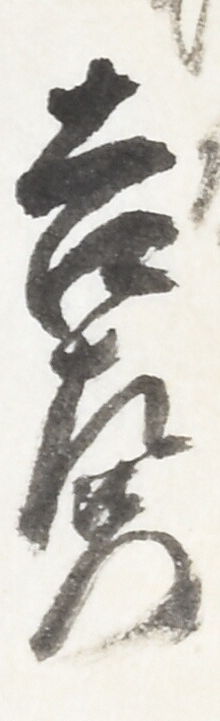吉左衛門
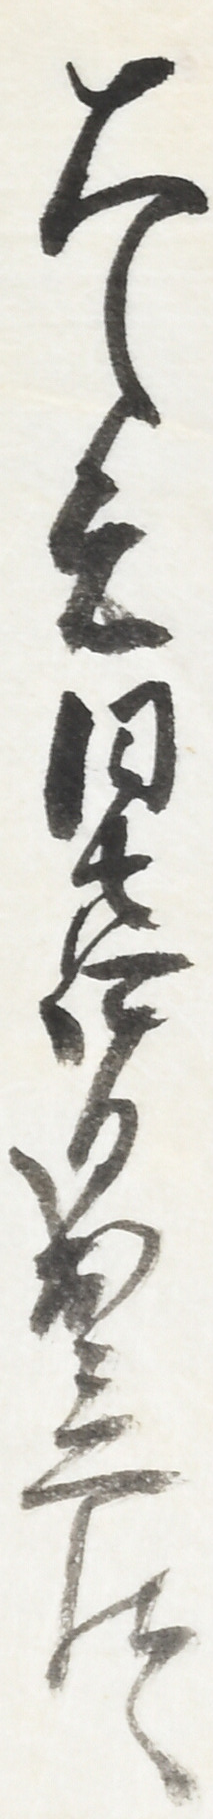右之者同廿四日出立仕候
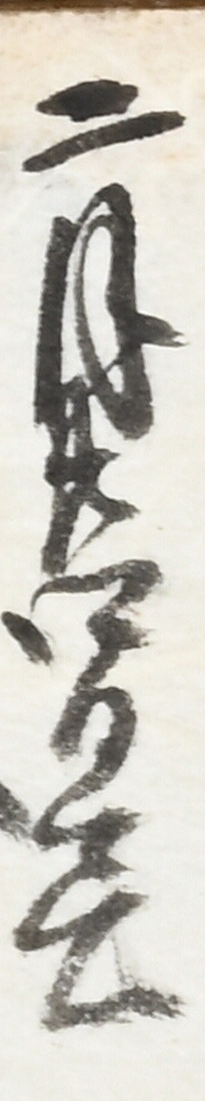二月廿四日嫡
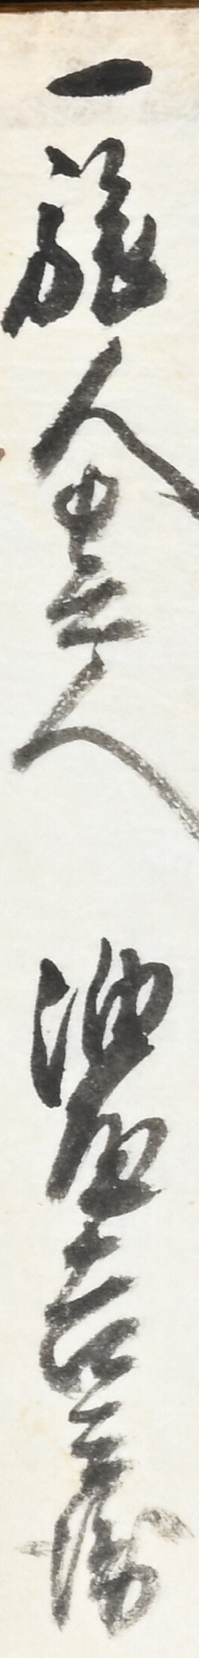一旅人壱人油屋吉兵衛
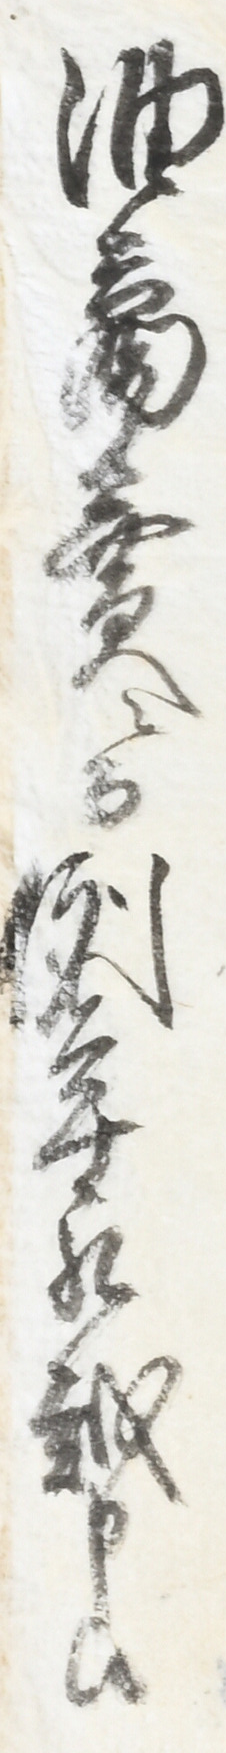油商売ニ而例年罷越申候

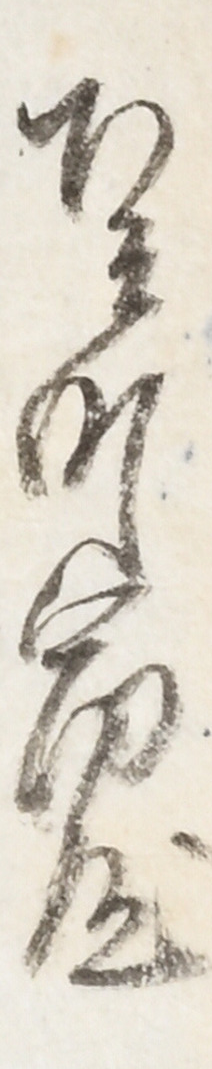下モ町冨屋
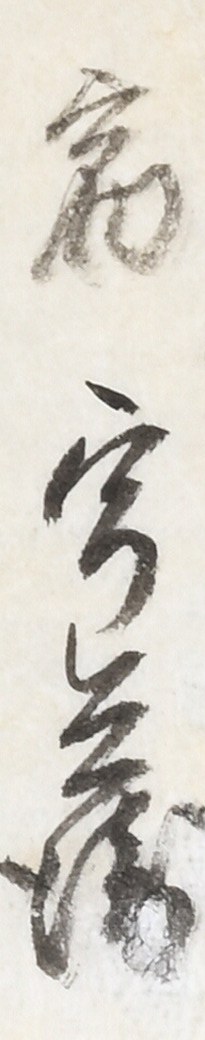宿宇兵衛
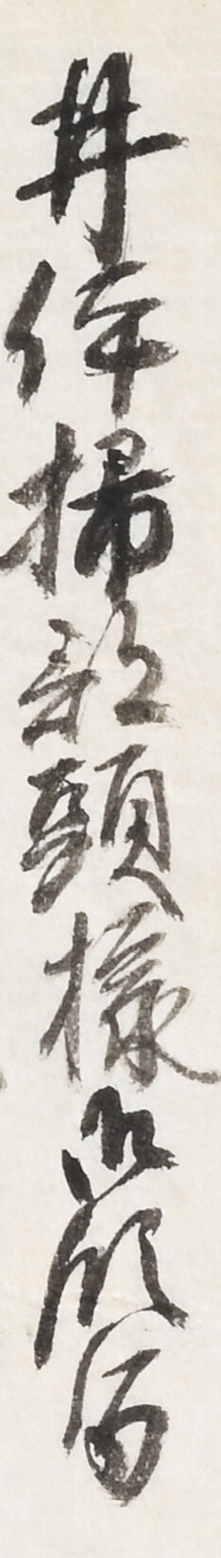井伊掃部頭様御領分
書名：旅人泊控帳
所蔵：伊那市立高遠町図書館・合同会社AMANE
